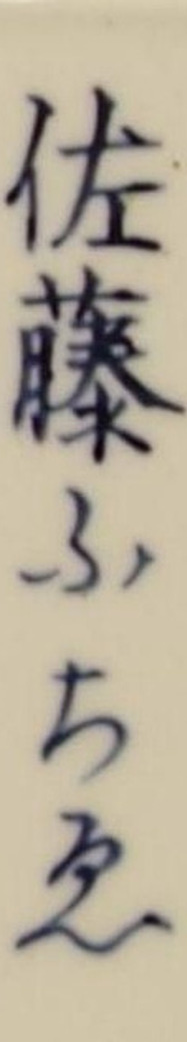佐藤ふちゑ
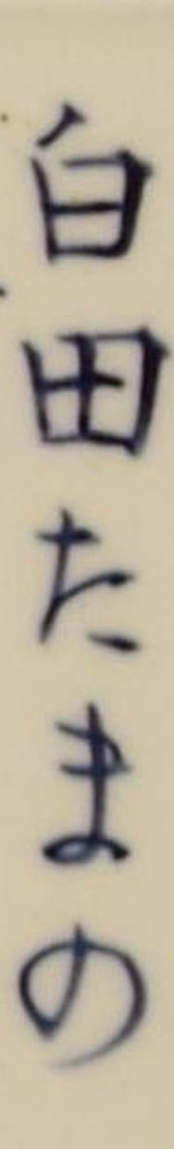白田たまの
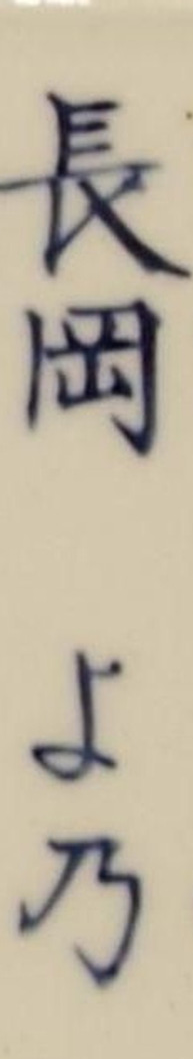長岡よの
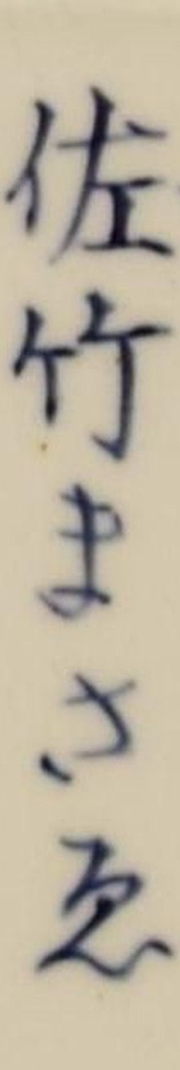佐竹まさえ
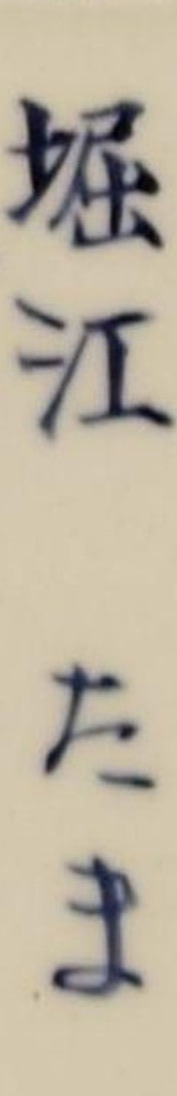堀江たま
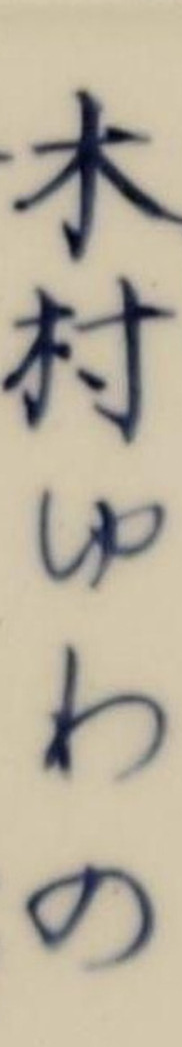木村ゆわの
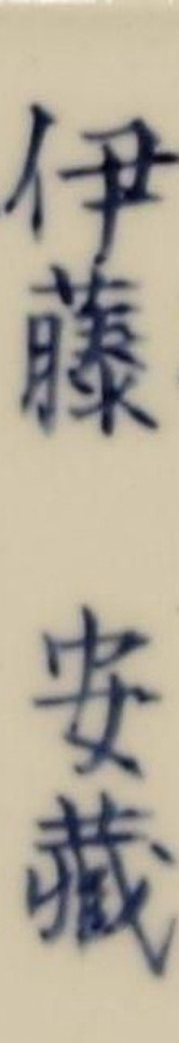伊藤安蔵
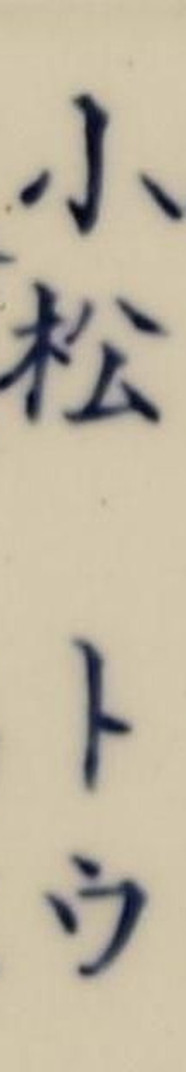小松トウ
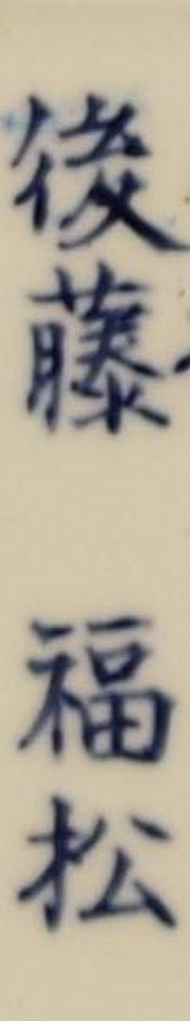後藤福松
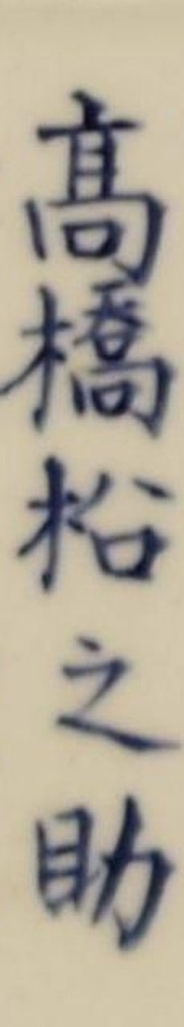高橋松之助
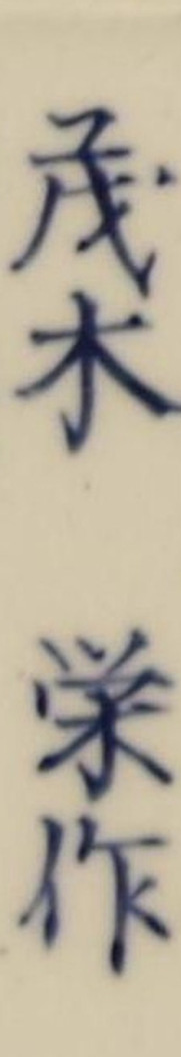茂木栄作
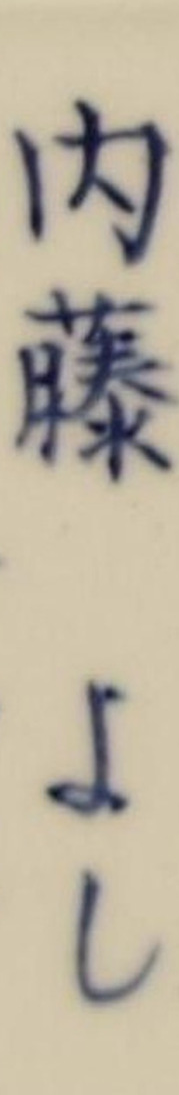内藤よし
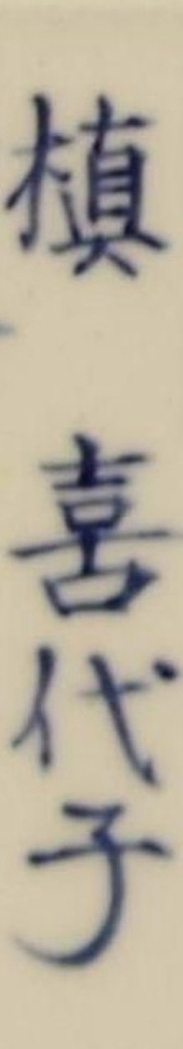槙喜代子
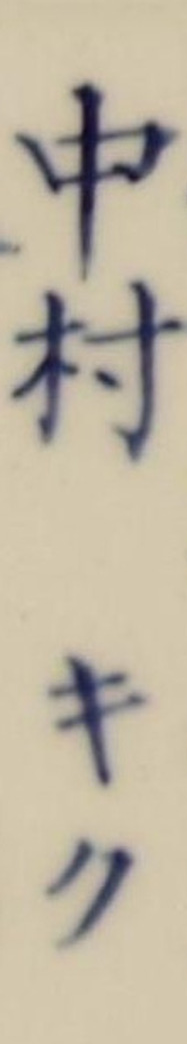中村キク
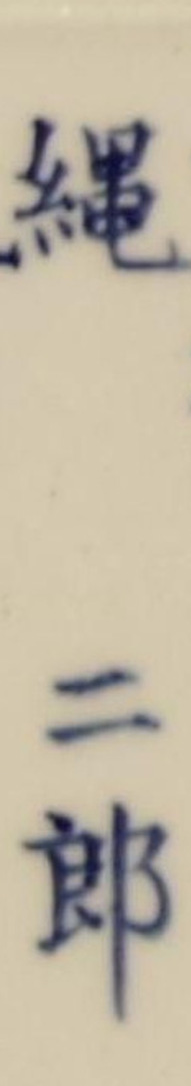縄二郎
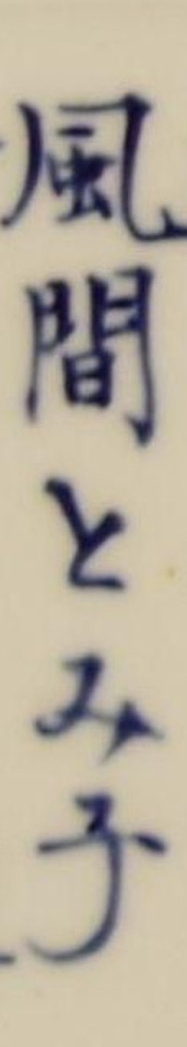風間とみ子
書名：A~D
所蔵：koyasan kongobuji
